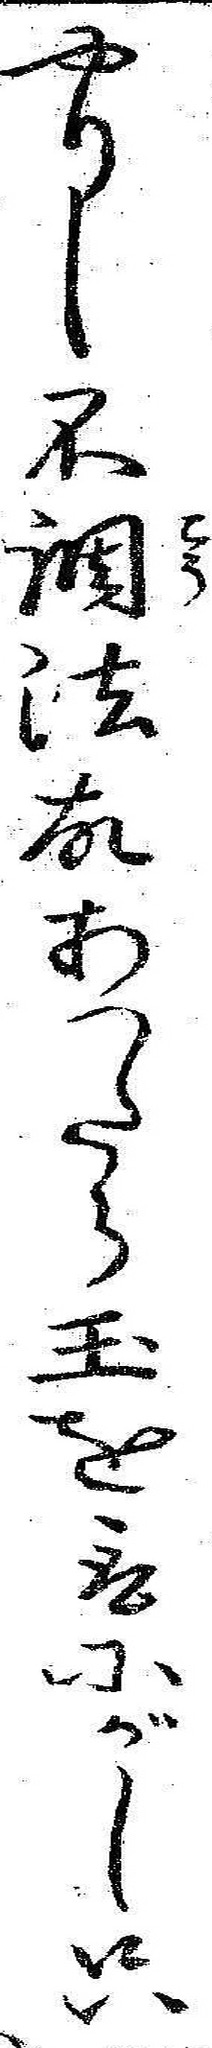やりし不調法故あつたら玉を取にがし只
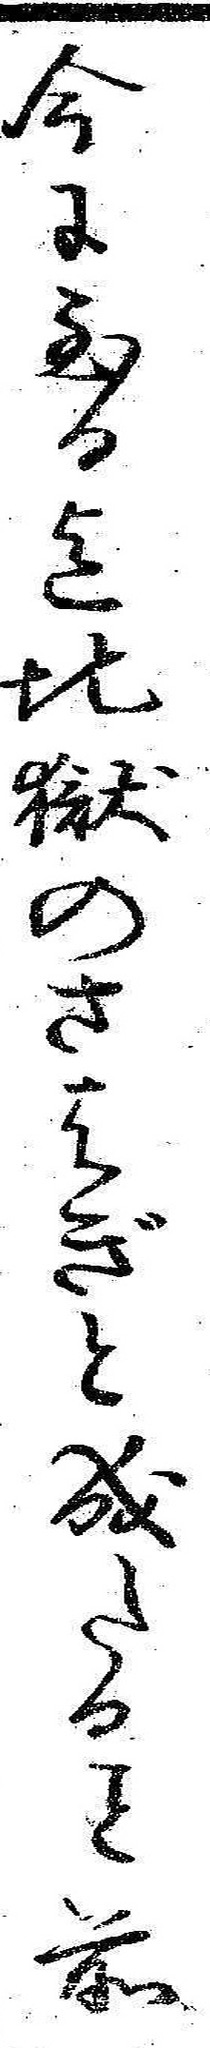今に至る迄地獄のさはぎと成したること前

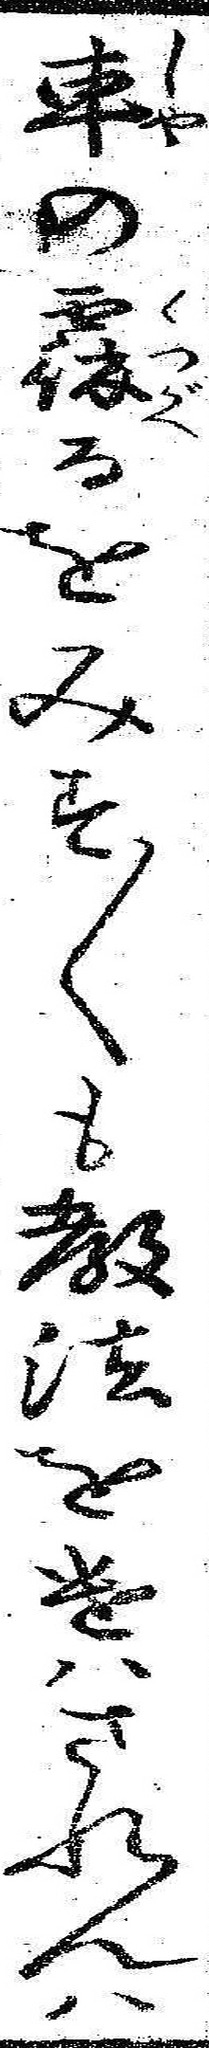車の覆るをみす〱も教法を遣はされんは
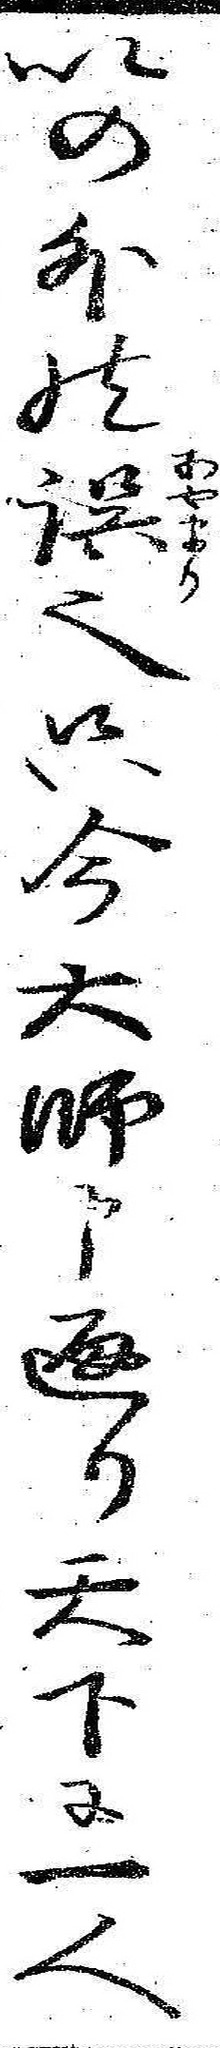以の外の誤也只今大師申通り天下に一人
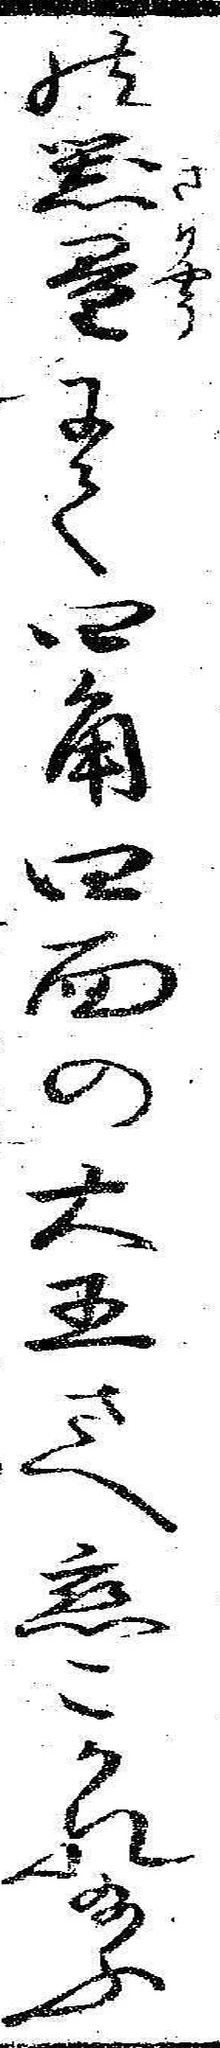の器量にて四角四面の大王さへ恋こかれ給ふ
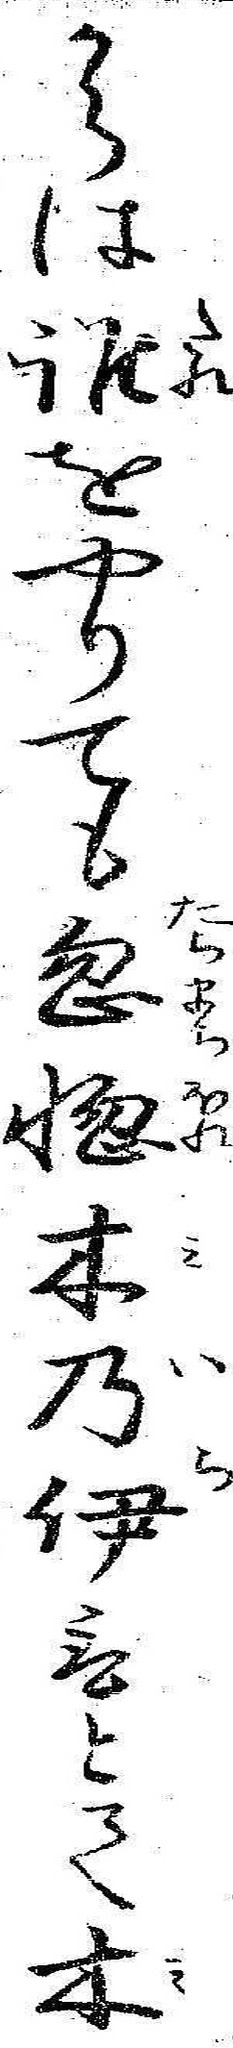からは誰をやりても忽惚木乃伊取とて木
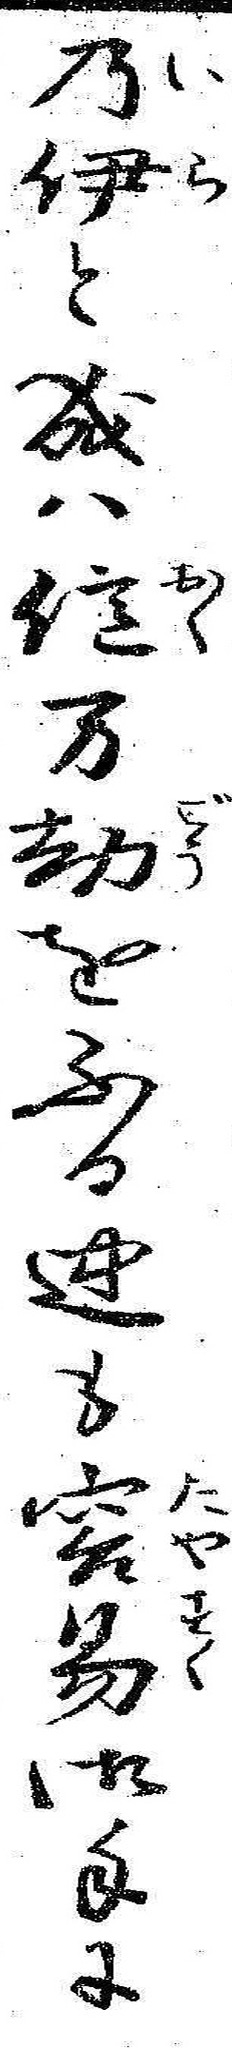乃伊と成は憶万劫をふる迚も容易御手に
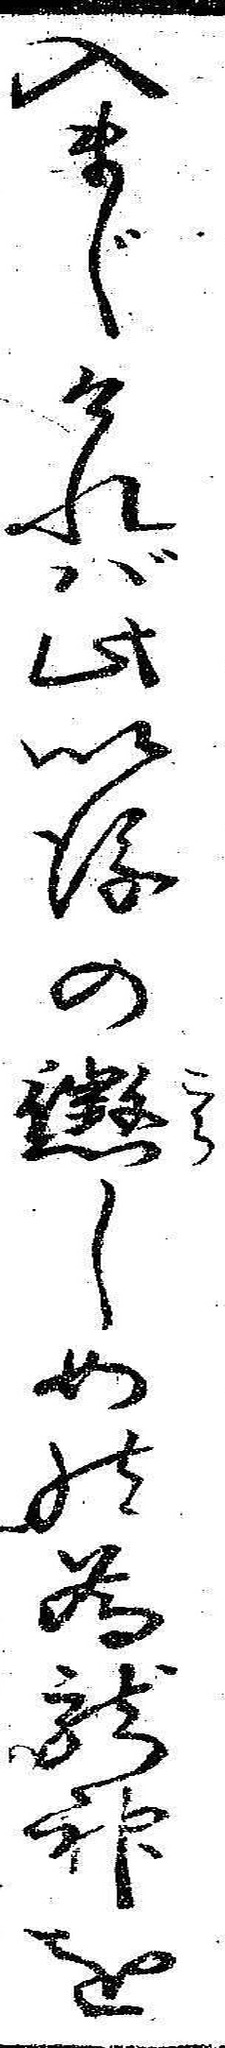入まじければ此以後の懲しめの為竜神を
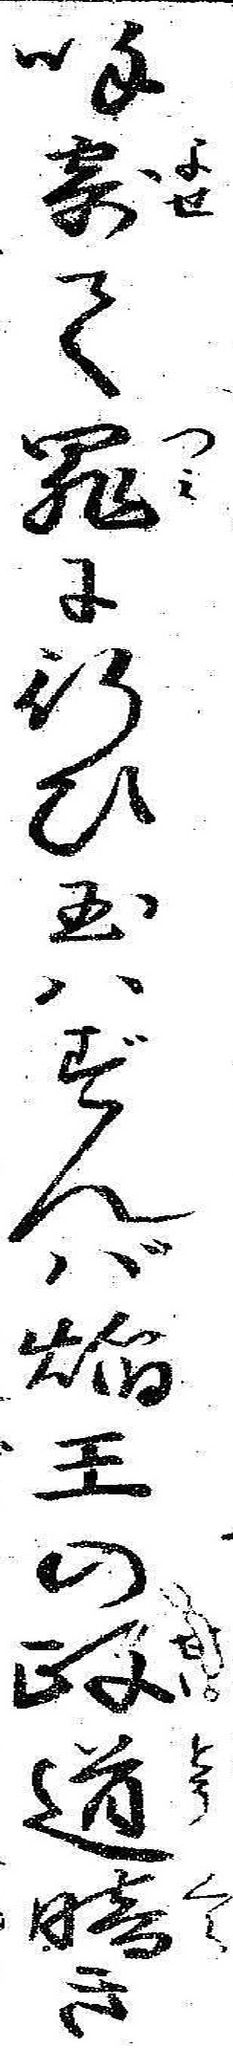呼寄て罪に行ひ玉はずんば焔王の政道暗き
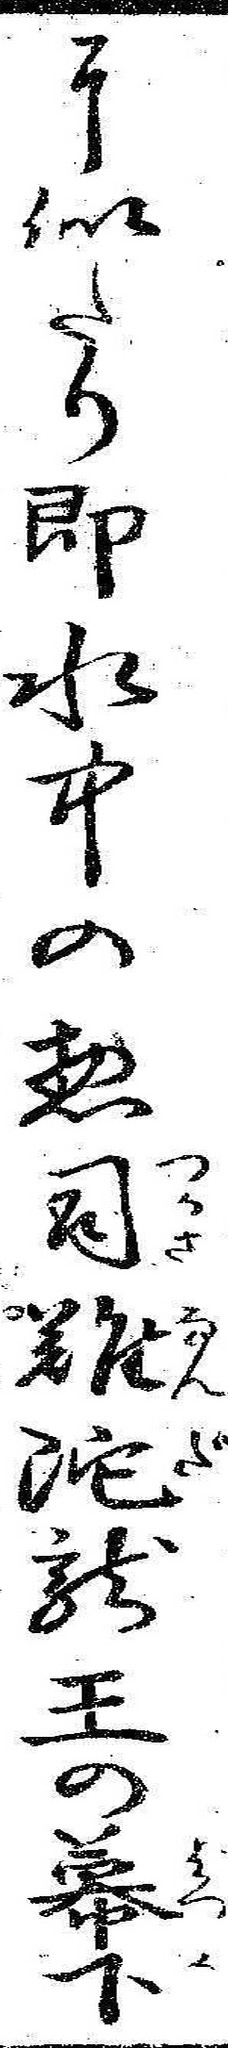に似たり即水中の惣司難陀竜王の幕下
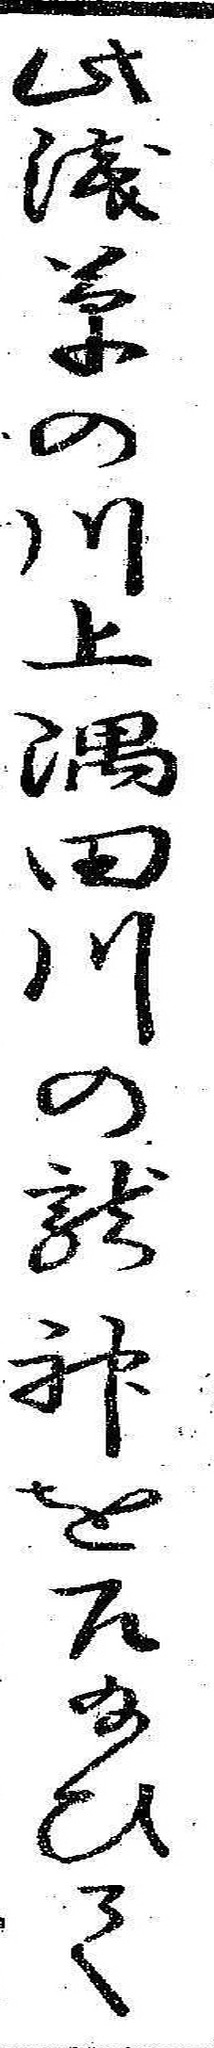此浅草の川上隅田川の竜神を召給ひて
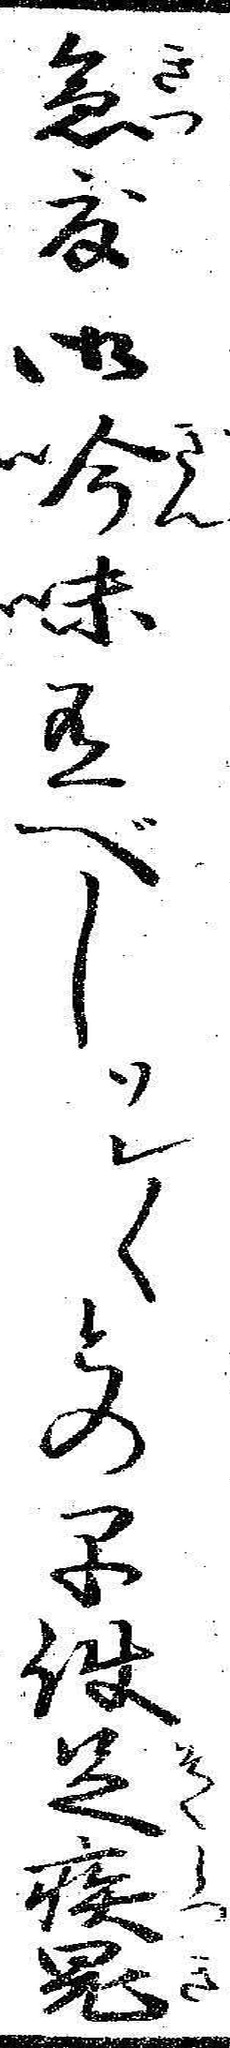急度御吟味有べし〱との早使足疾鬼
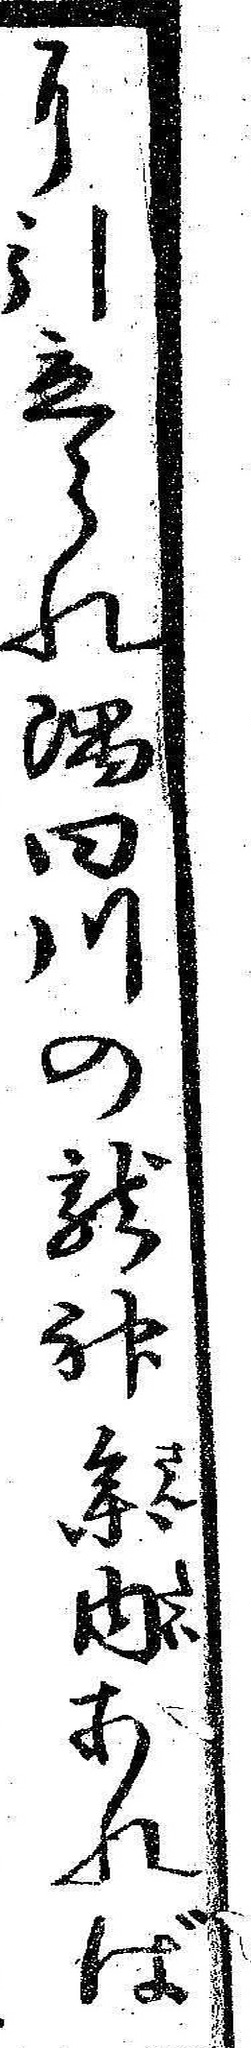に引立られ隅田川の竜神参内あれば
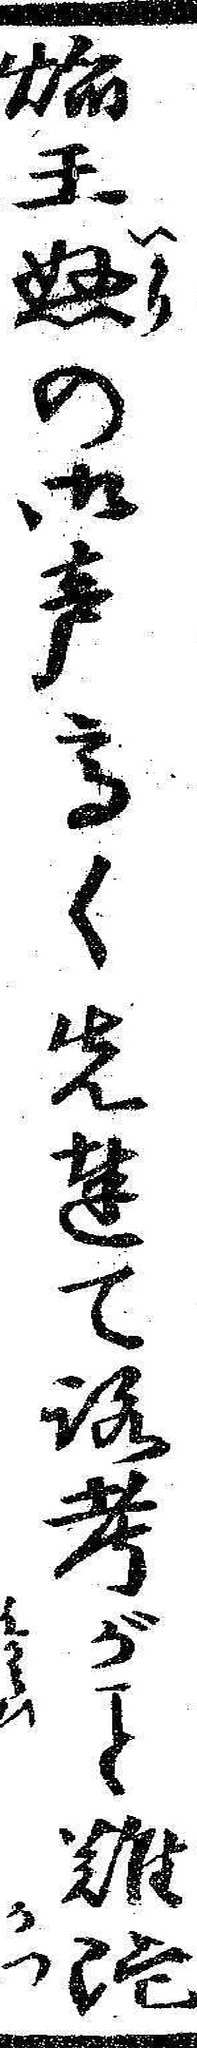焔王怒の御声高く先達て路考がこと難陀
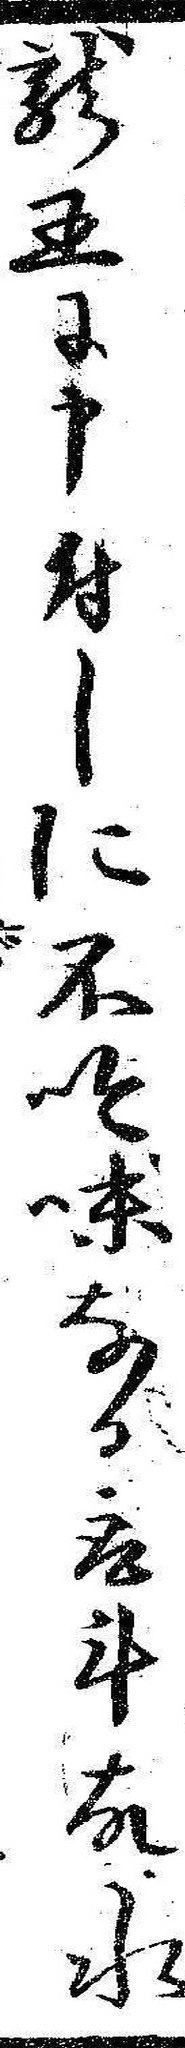竜王に申付しに不吟味なる取計故水
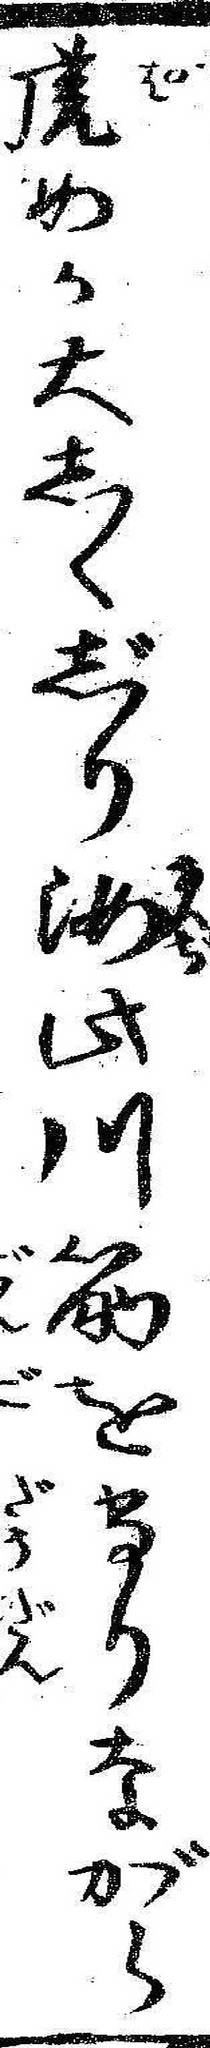虎めか大しくじり汝此川筋を守りながら
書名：根無草後編
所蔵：国文学研究資料館
